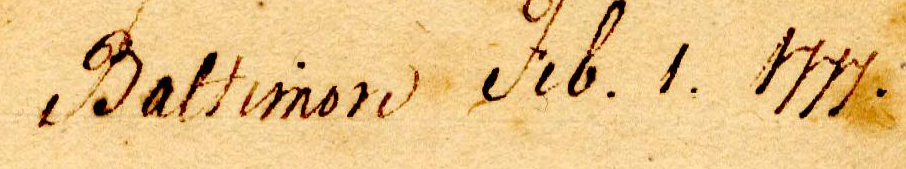Baltimore Feb. 1. 1777.
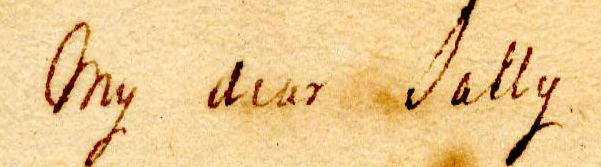My dear Sally
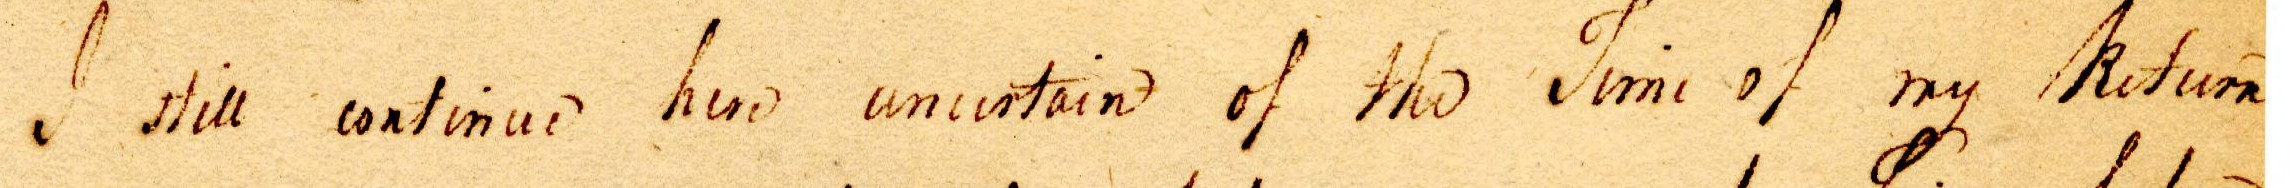I still continue here uncertain of the Time of my Return
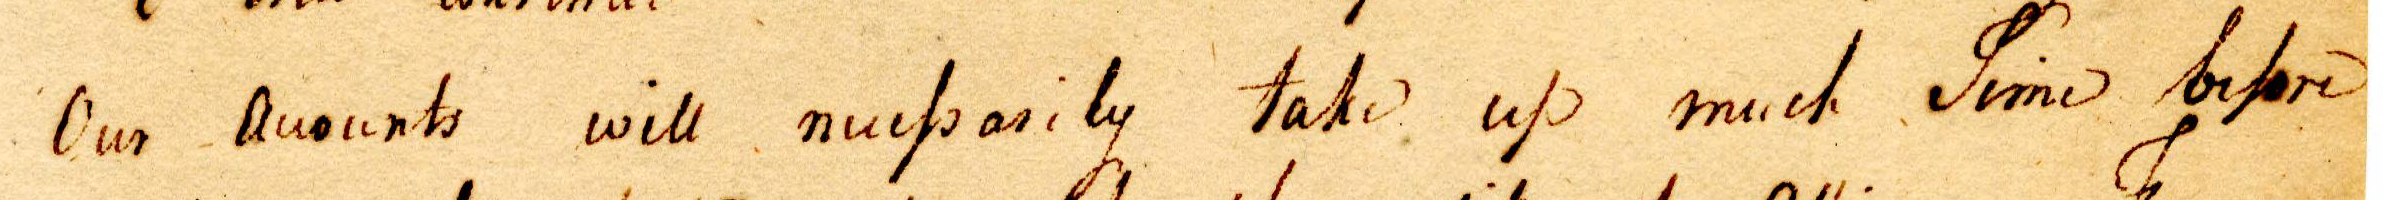Our Accounts will necessarily take up much Time before
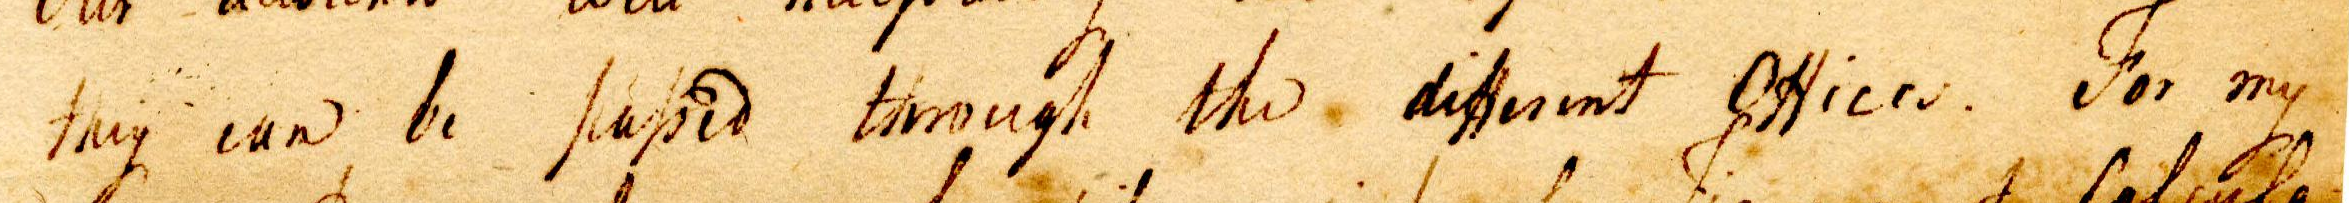they can be passed through the different Offices. For my
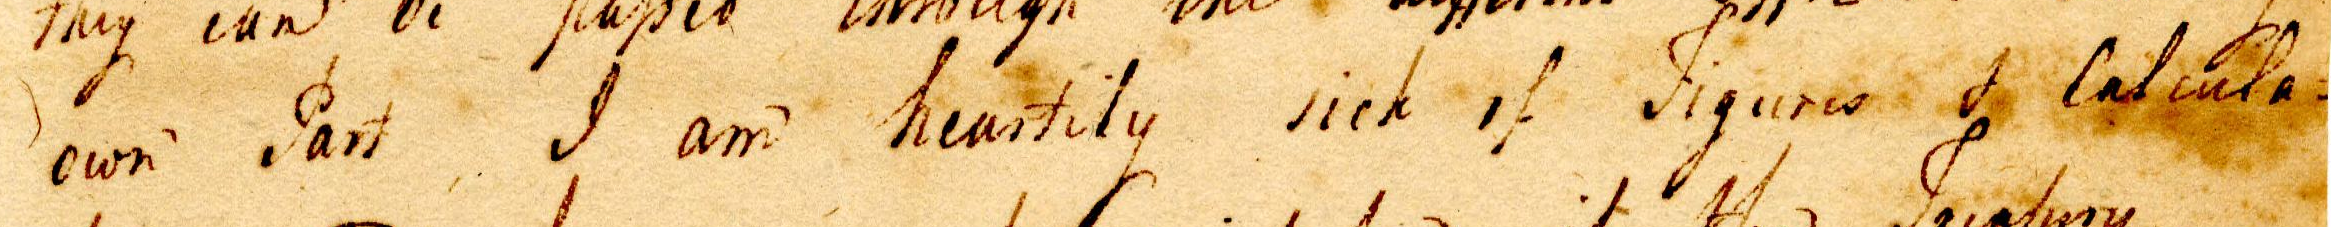own Part I am heartily sick of Figures & Calcula-
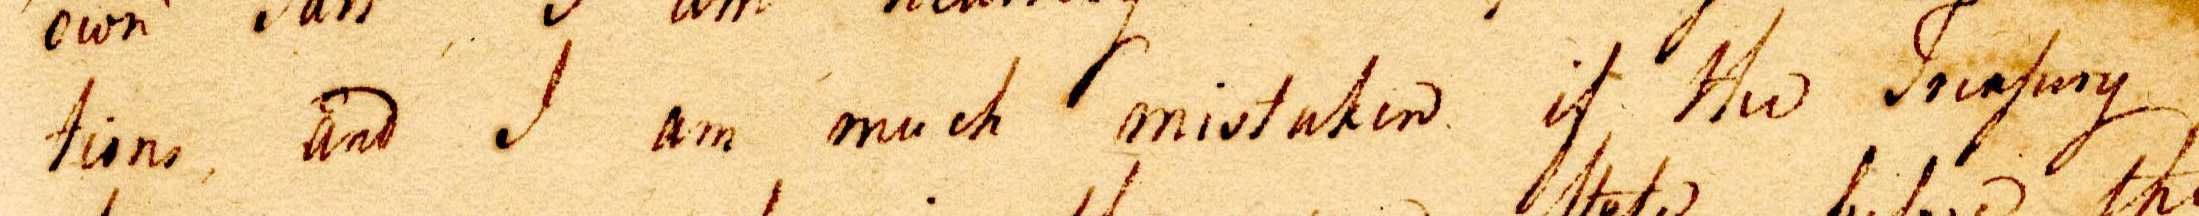tions and I am much mistaken if the Treasury
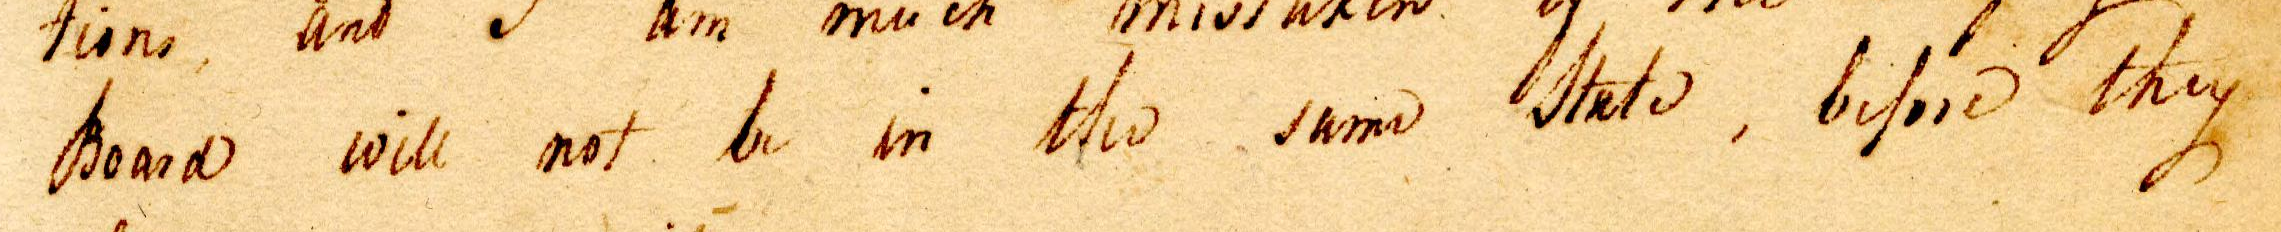Board will not be in the same State, before they
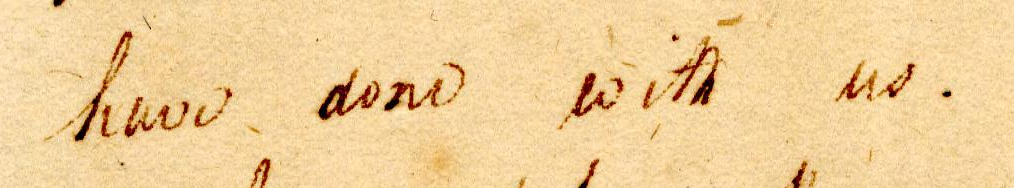have done with us.
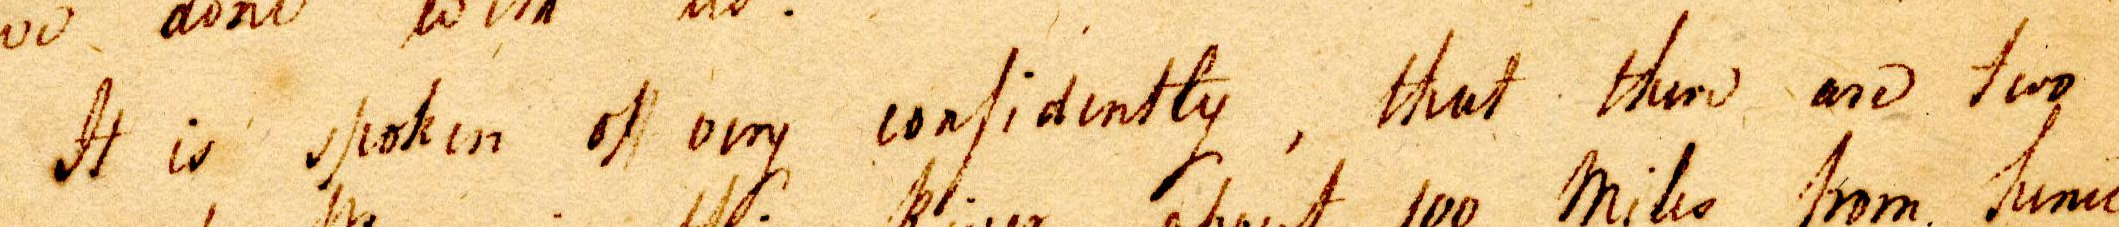It is spoken of very confidently, that there are two
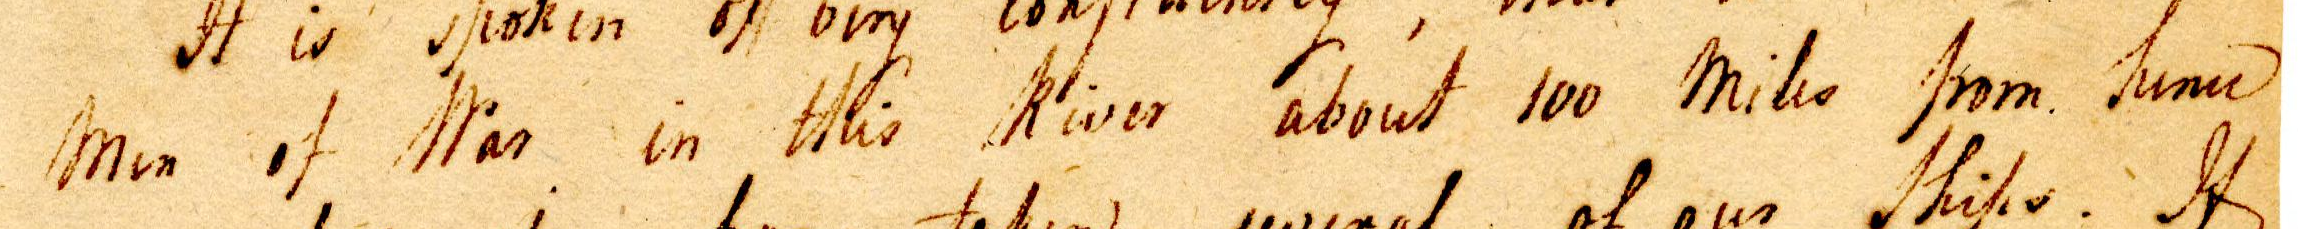Men of War in this River about 100 Miles from hence
